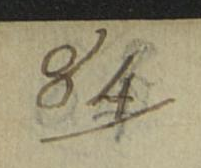84
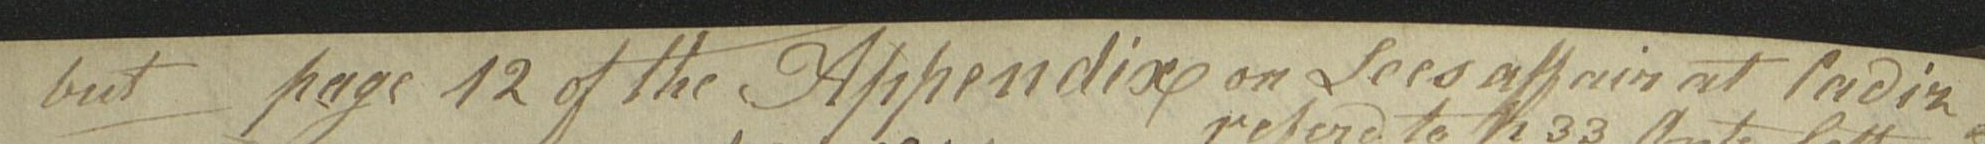but page 12 of the Appendix on Lees affair at Cadiz
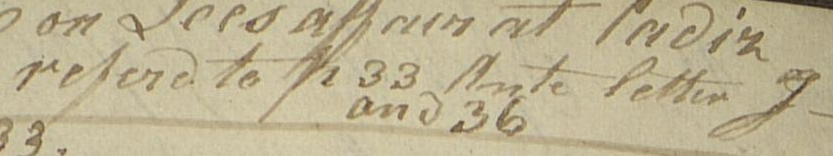referd to p 33 Ante letter J
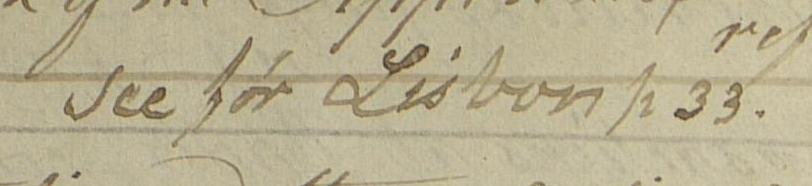see for Lisbon p33.
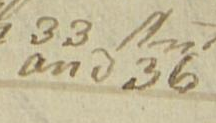and 36
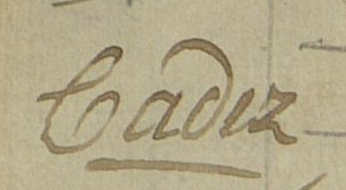Cadiz
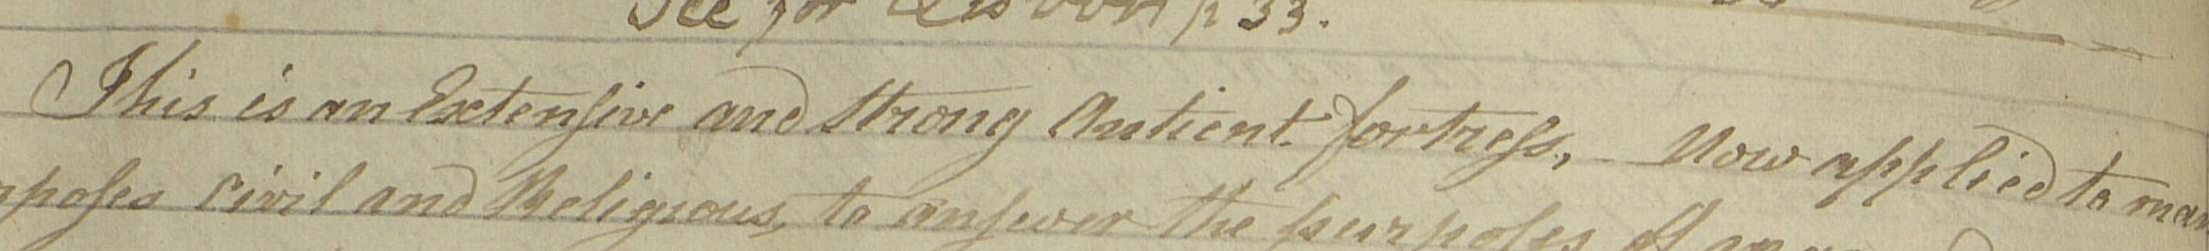This is an Extensive and strong antient fortress, Now applied to man
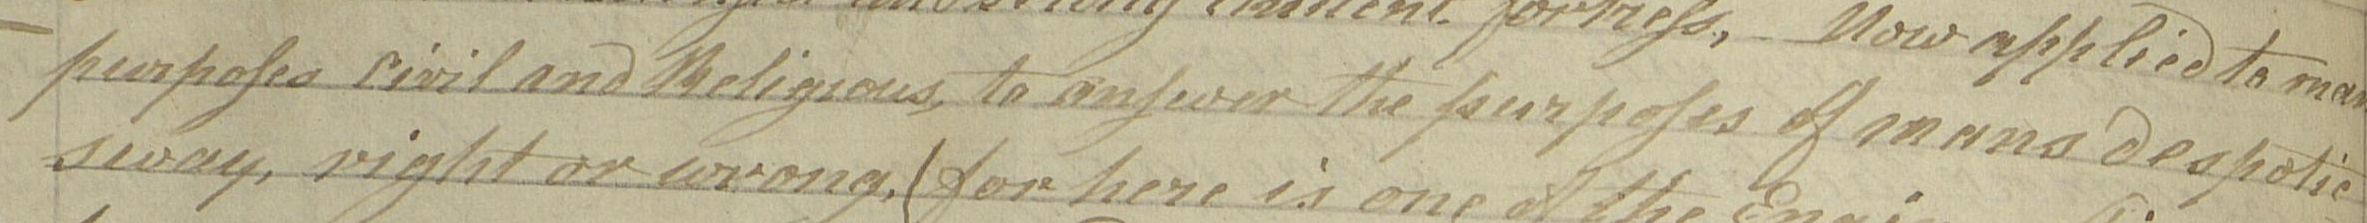purposes civil and Religious to answer the purposes of mans despotic
